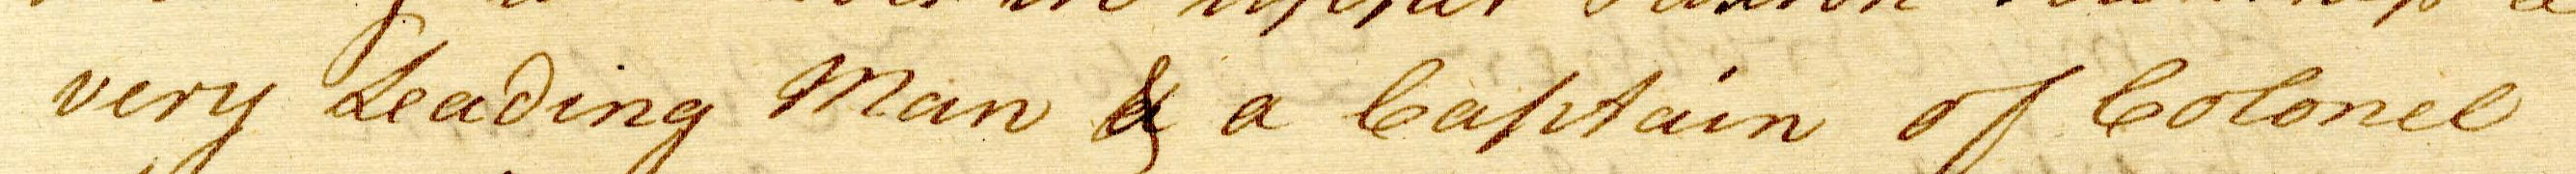very Leading Man & a Captain of Colonel
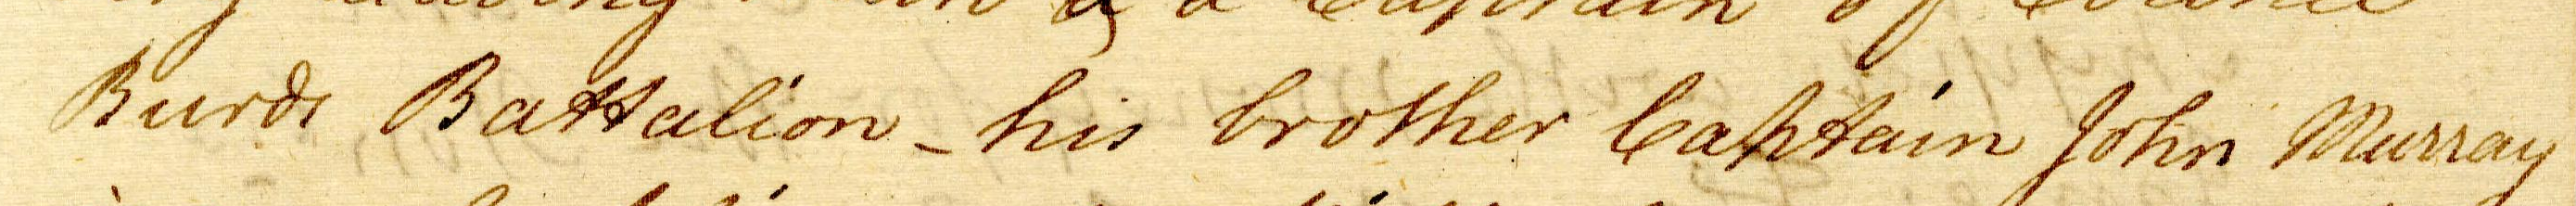Burds Battalion- his brother Captain John Murray
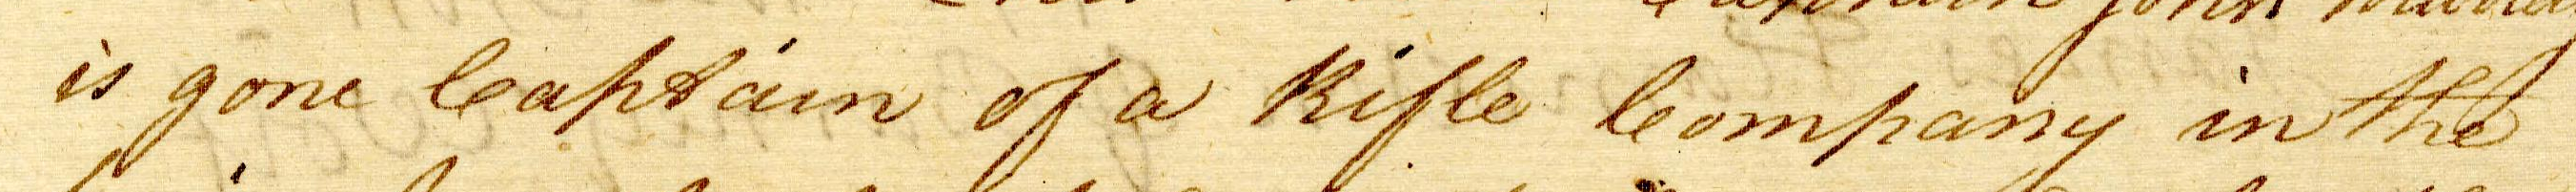is gone Captain of a Rifle Company in the
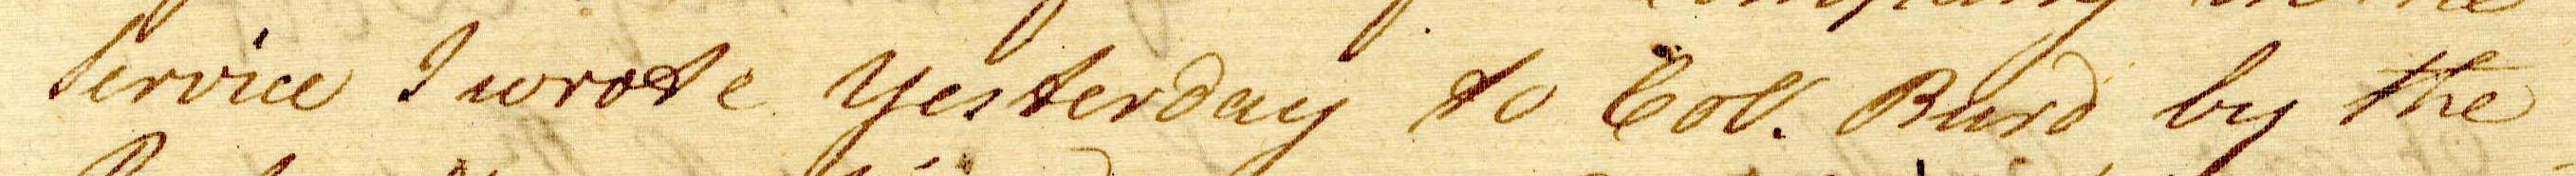service I wrote yesterday to Col. Burd by the
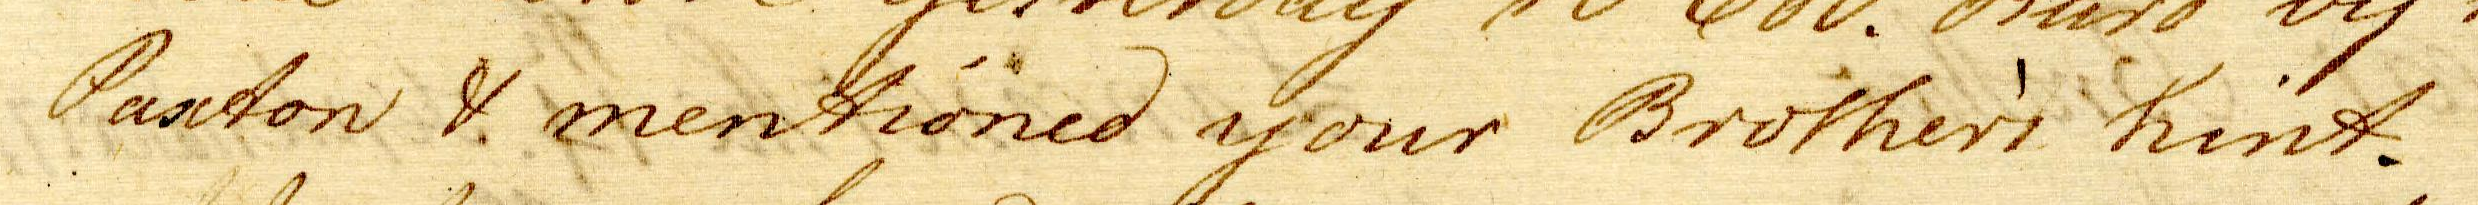Paxton & mentioned your Brother's hint.
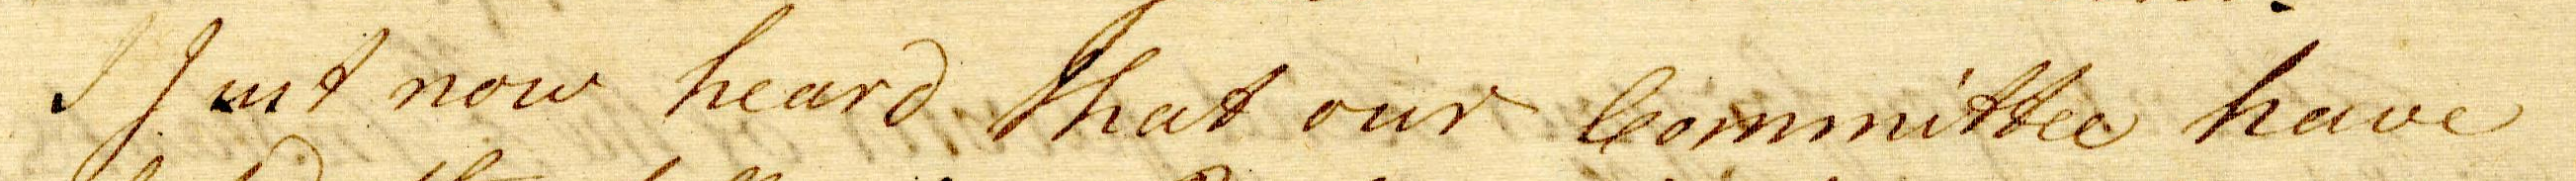I just now heard that our Committee have
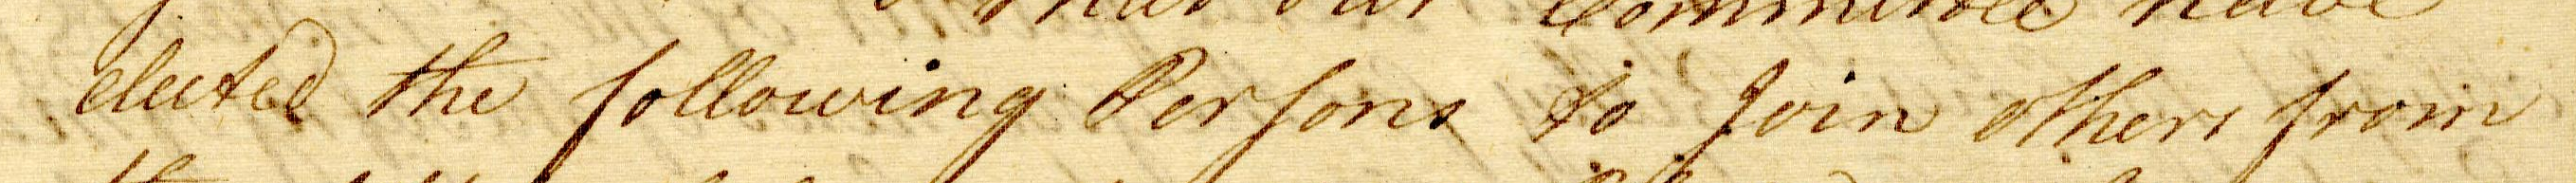elected the following Persons to Join others from
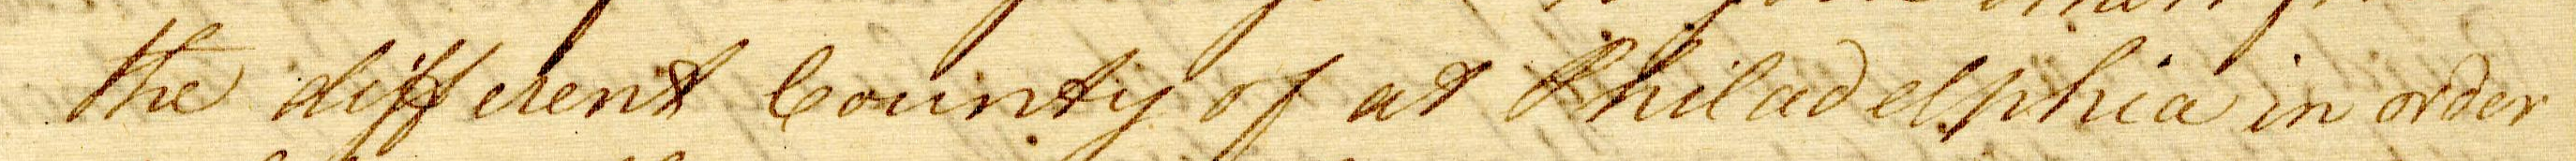the different County of at Philadelphia in order
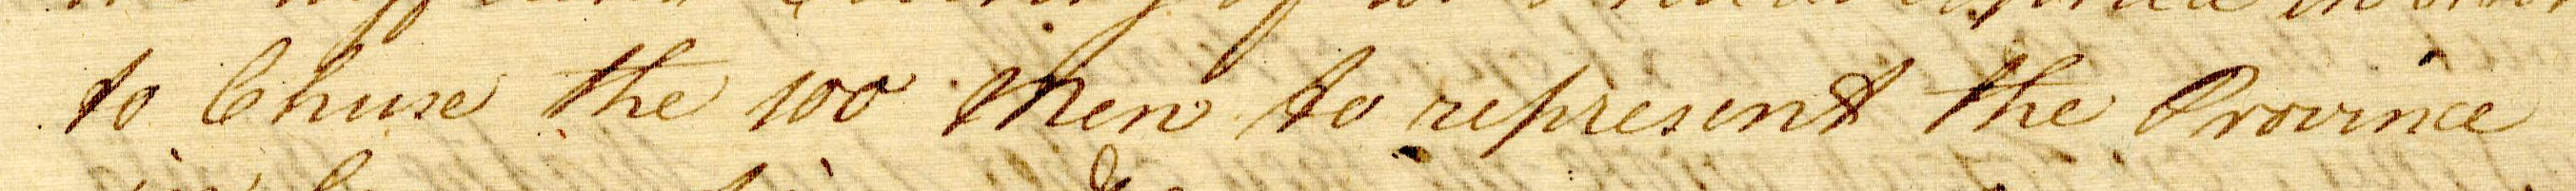to Chuse the 100 then to represent the Province
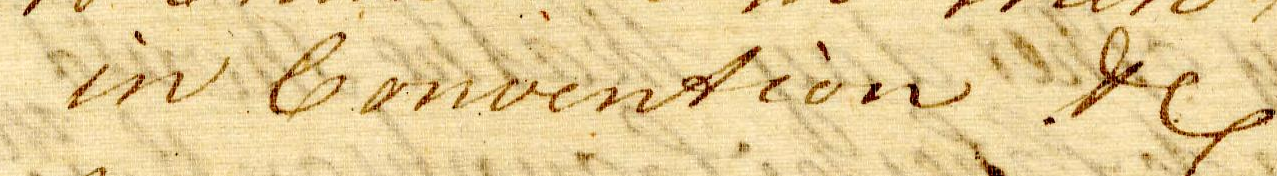in Convention &c
